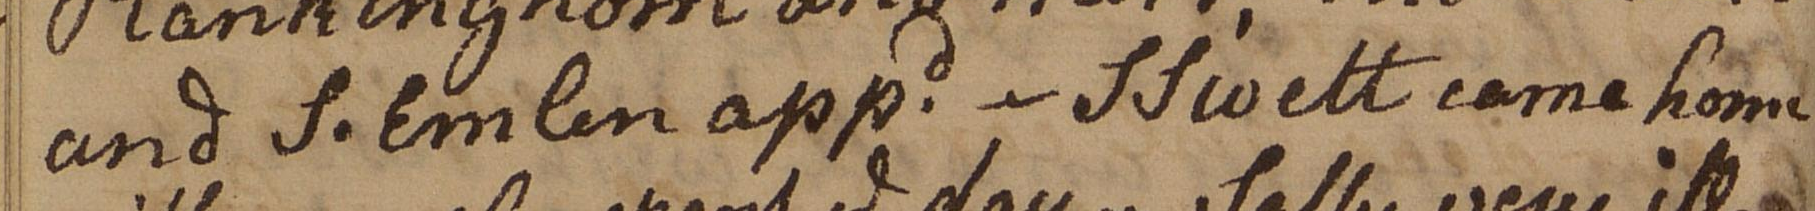and S. Emlen app^d.- S Swett came home
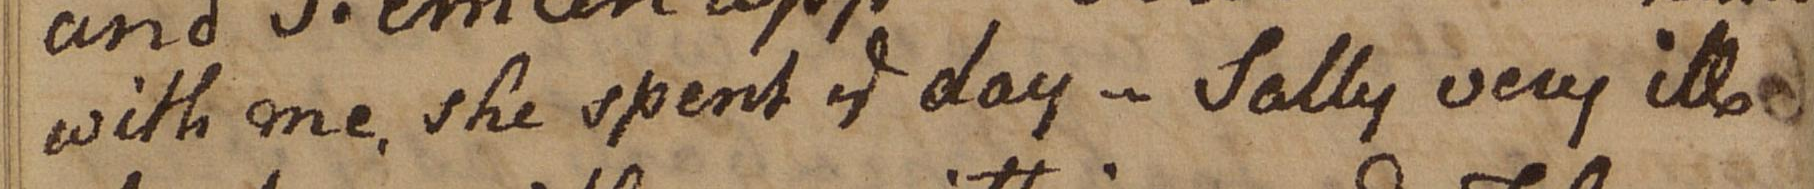with me, she spent y^e day- Sally very ill
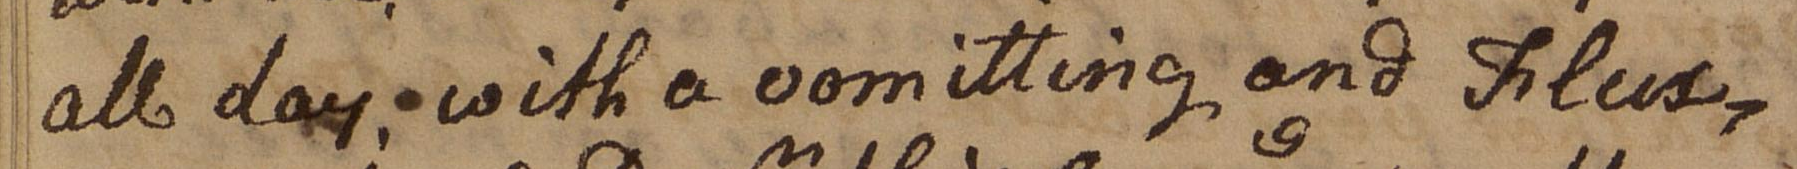all day; with a vomitting, and Flux,
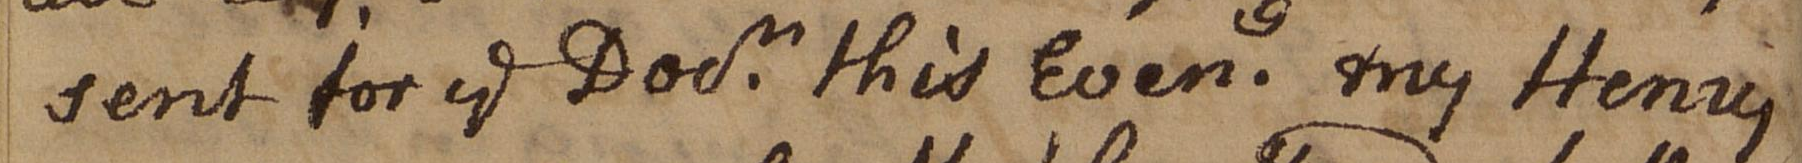sent for y^e Doc^r. this Even^g. my Henry
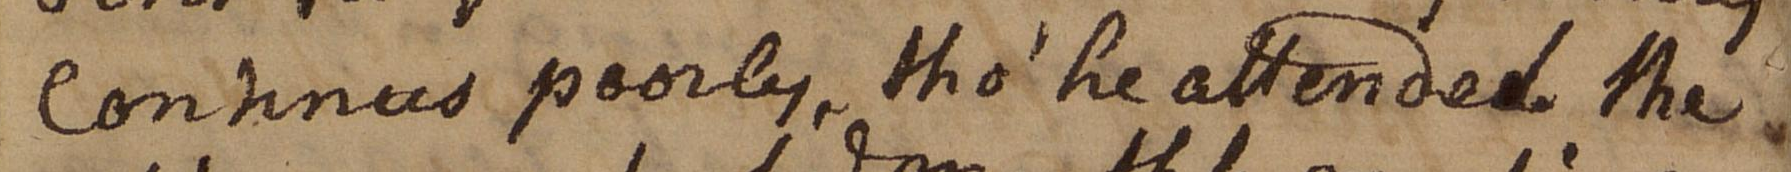continus poorly, tho' he attended the
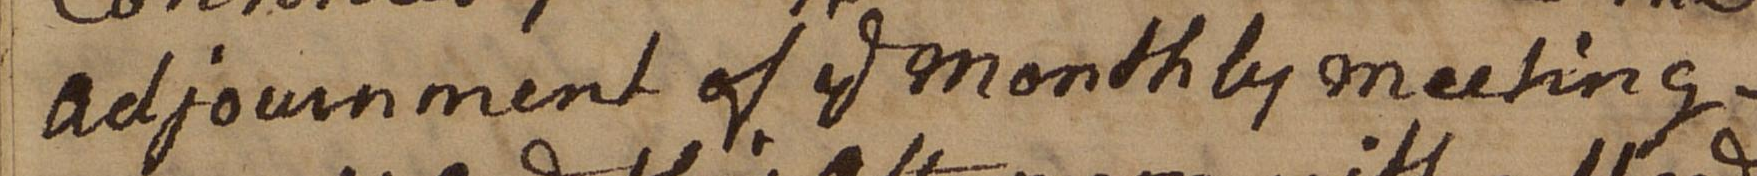adjournment of y^e monthly meeting-
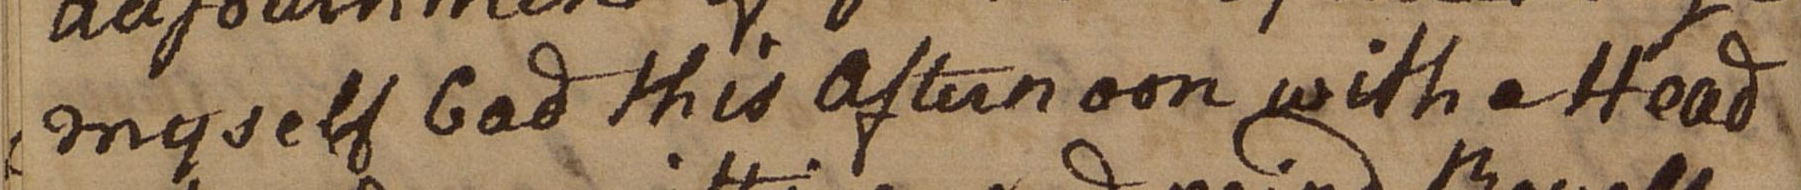myself bad this Afternoon with a Head
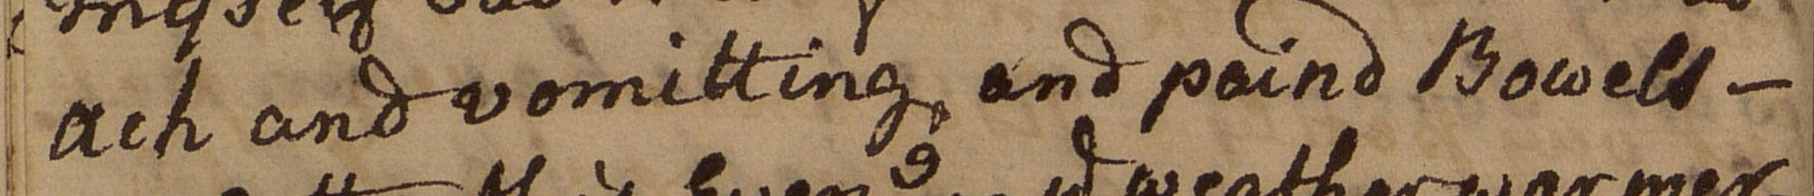Ach and vomitting, and paind Bowels-
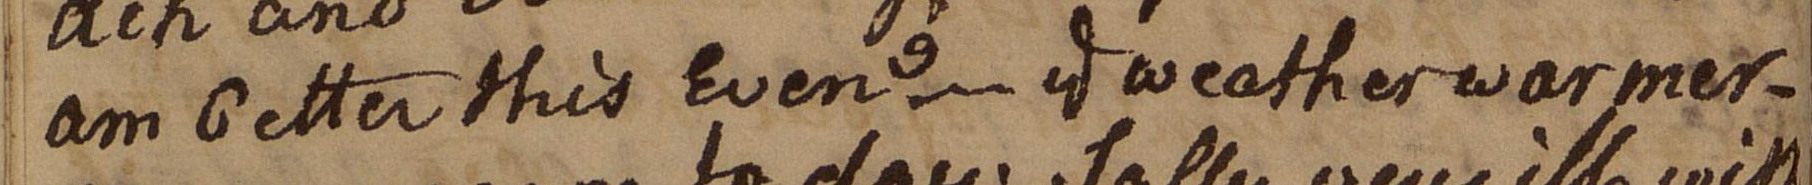am better this Even^g- y^e weather warmer-
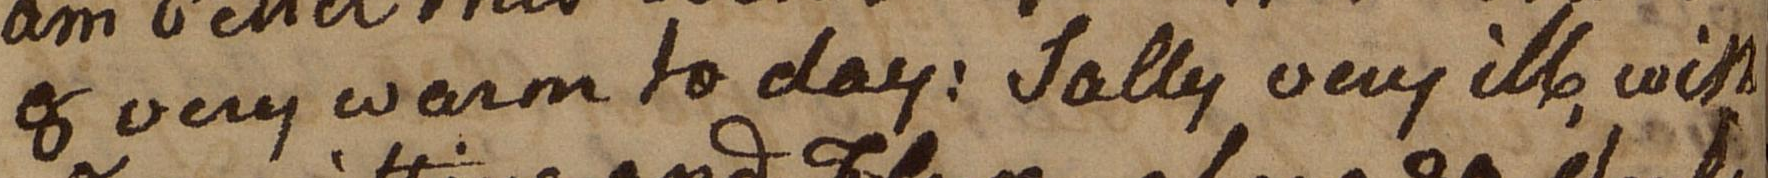8 very warm to day: Sally very ill, with
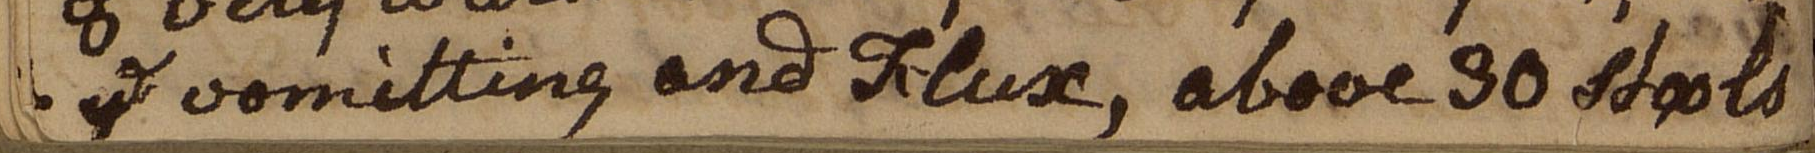y^e vomitting and Flux, above 30 Stools
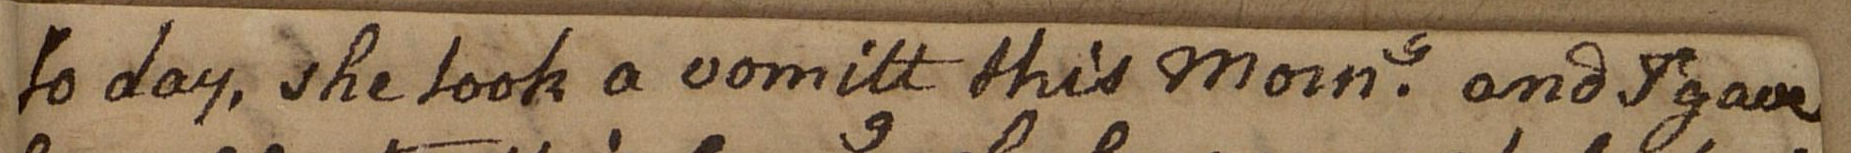to day, she took a vomitt this morn^g. and I gave
